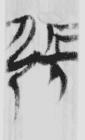張
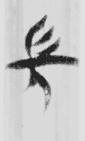𡵂
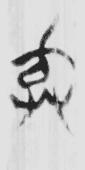弃
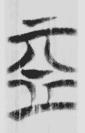亞
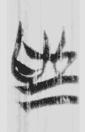爲
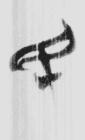民
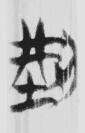型
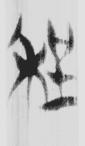程
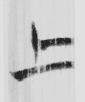上
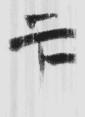下
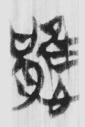{肙隹心}
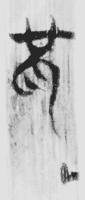咠
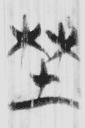埜
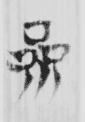參
